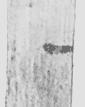一
